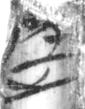往
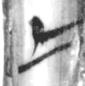亡
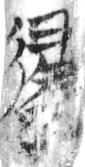歸
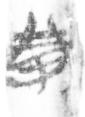○（荆）
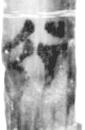𫵖
